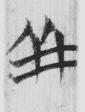并
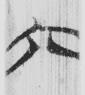六
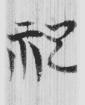祀
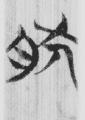肰
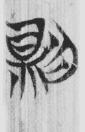則
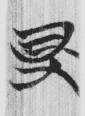𠭁
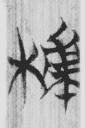{木甫}
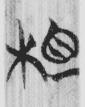相
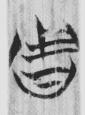周
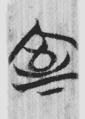室
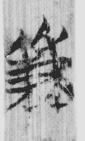兼
